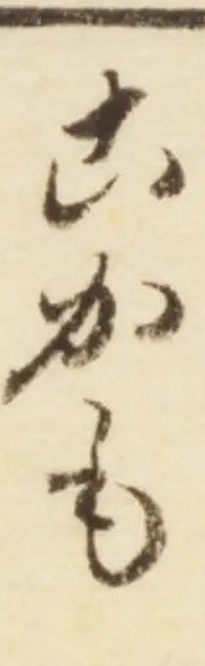こかも

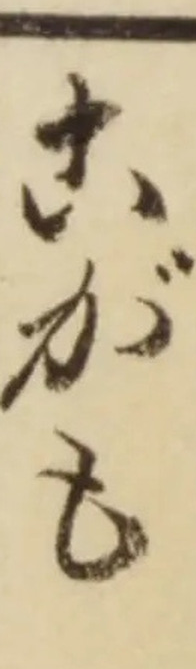こがも
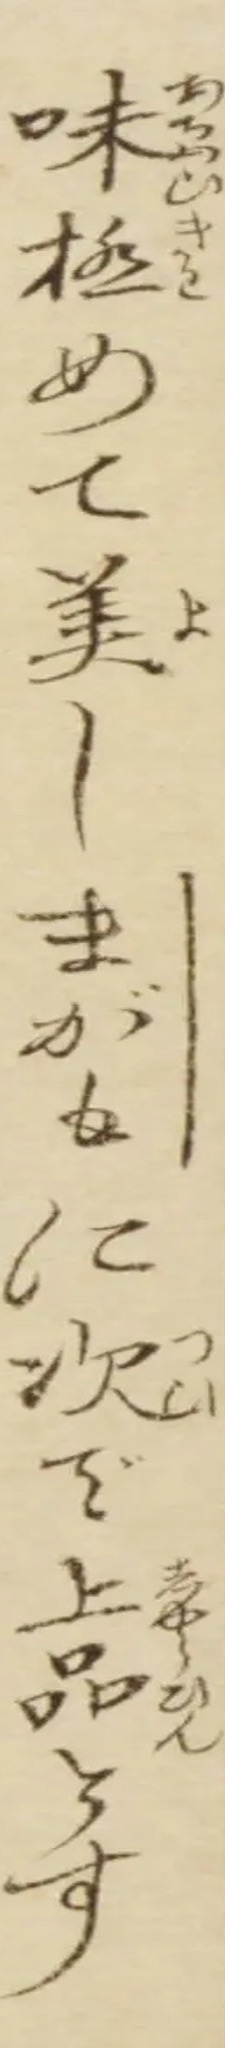味極めて美しまがもに次で上品とす
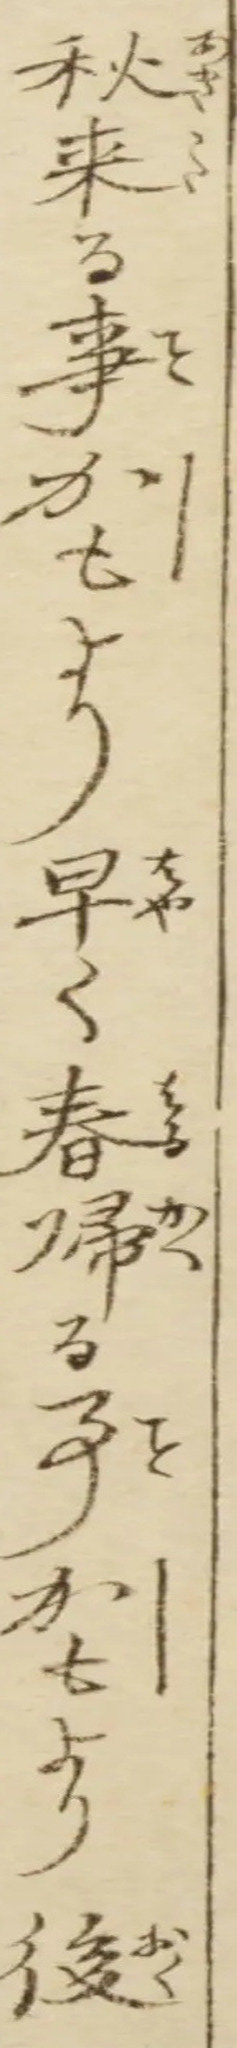秋来る事かもより早く春帰る事かもより後
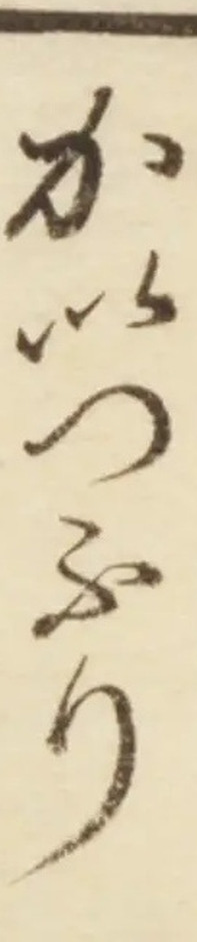かいつふり

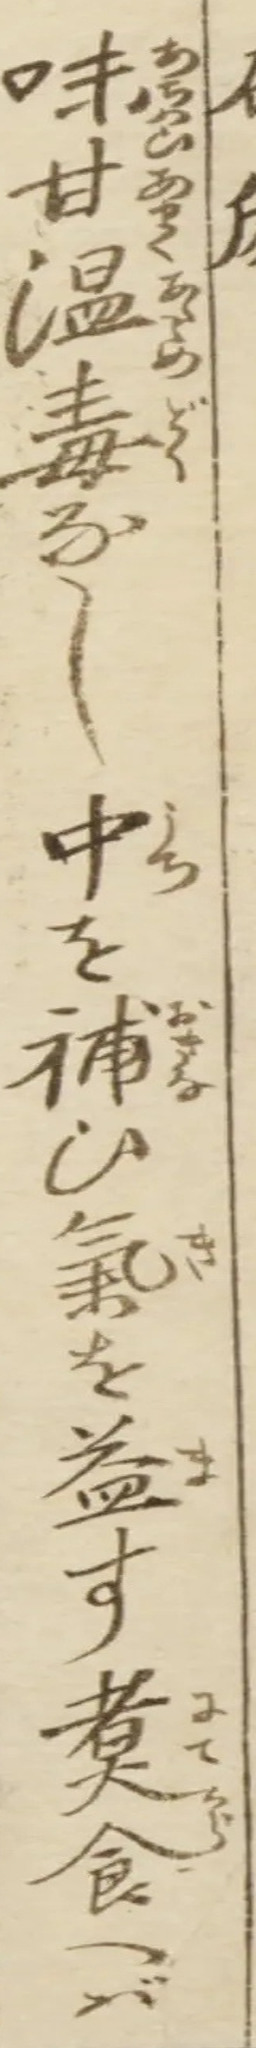味甘温毒なし中を補ひ気を益す煮食へば
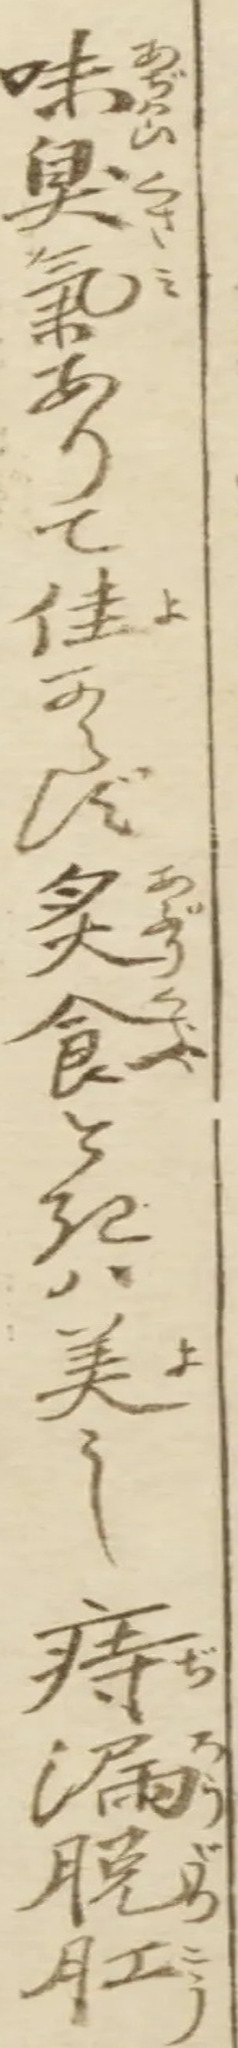味臭気ありて佳からず炙食ときは美し痔漏脱肛
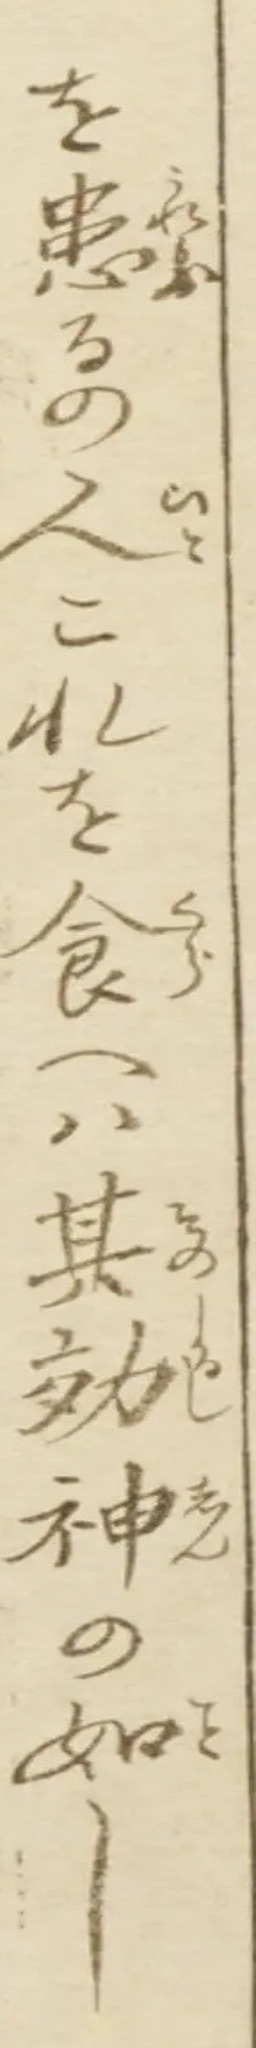を患るの人これを食へは其効神の如し
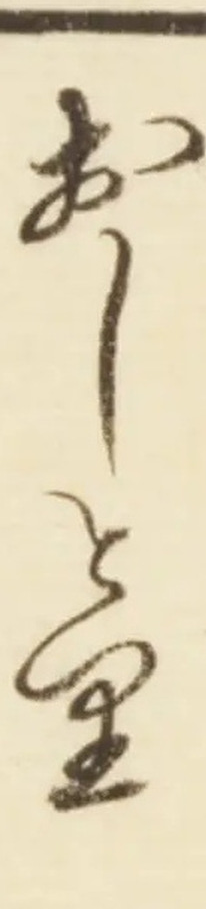おしとり

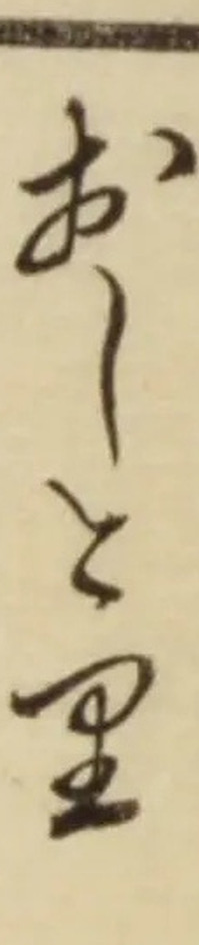おしとり
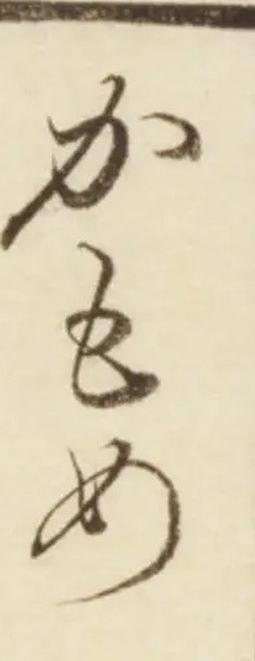かもめ

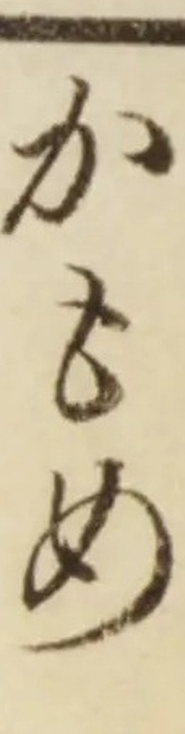かもめ
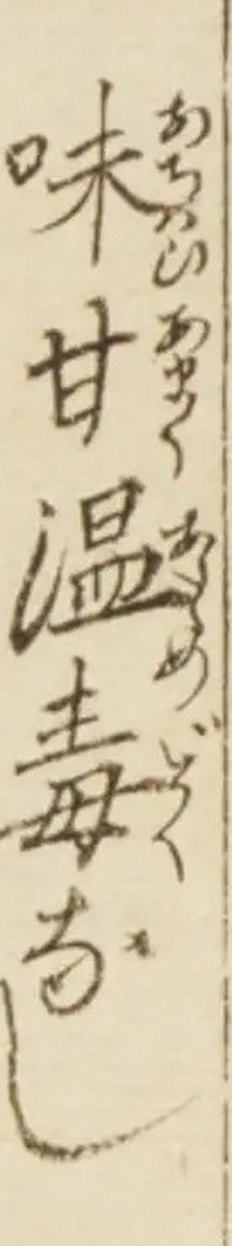味甘温毒なし
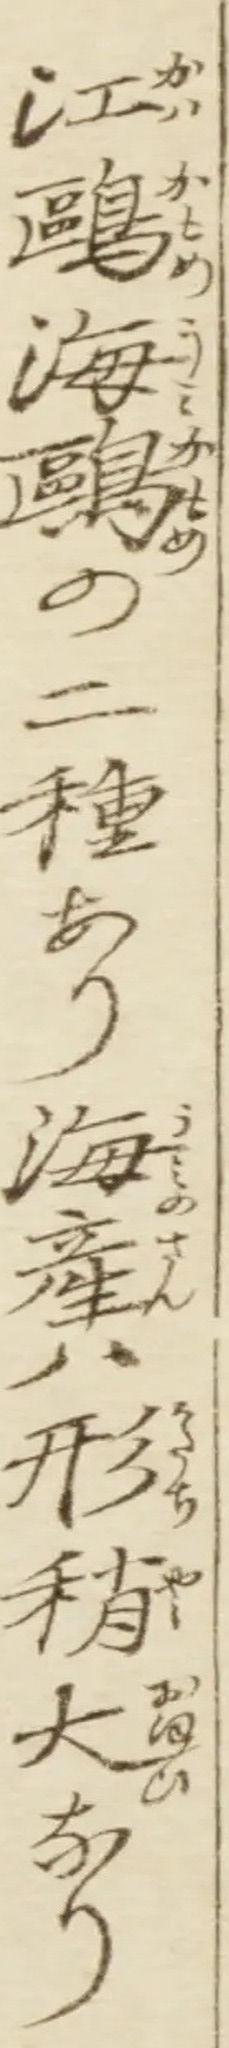江鴎海鴎の二種あり海産は形稍大なり

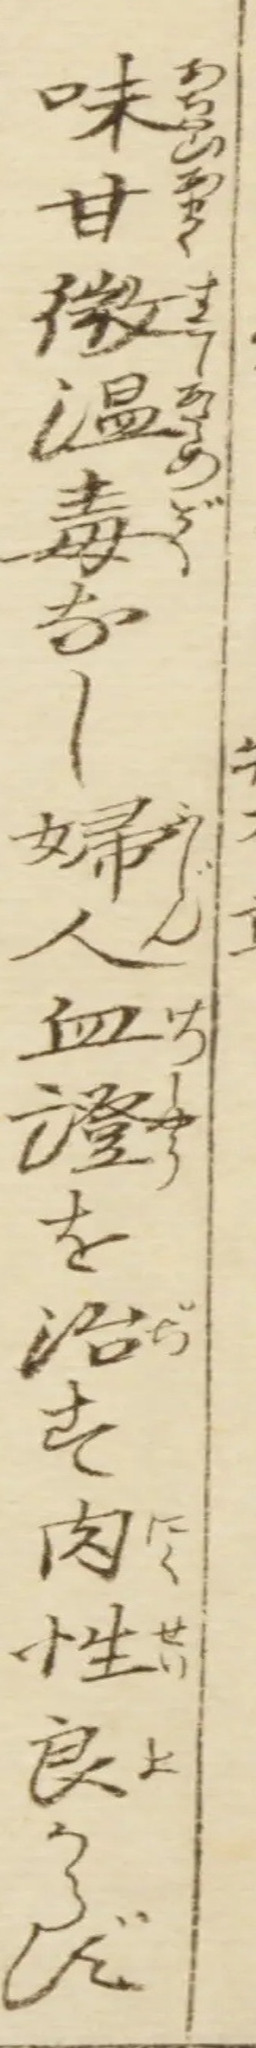味甘微温毒なし婦人血証を治す肉性良からず
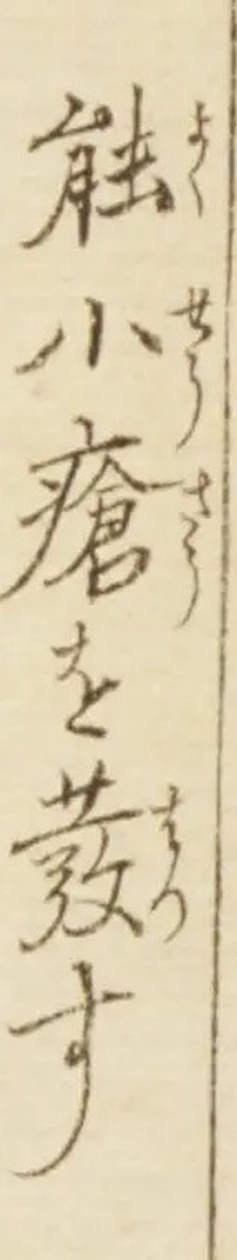能小瘡を発す
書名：華鳥譜
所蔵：国立国会図書館 National Diet Library, JAPAN
